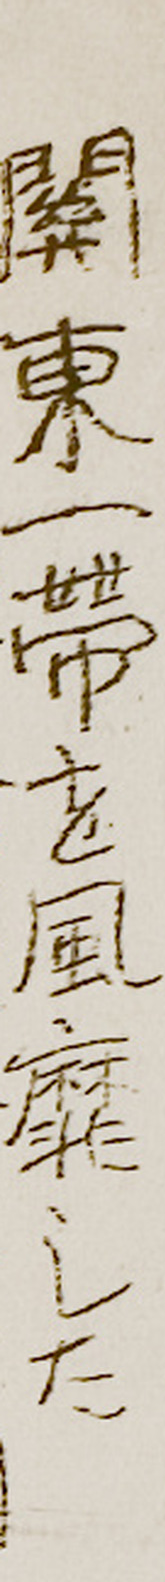関東一帯を風靡した
